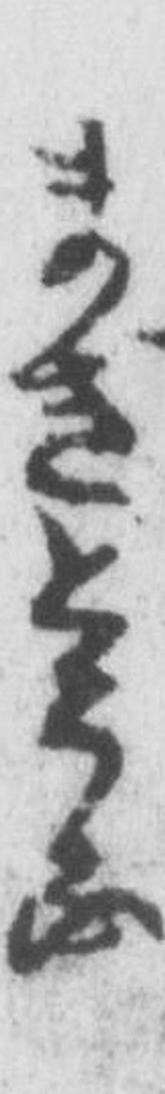まきとうふ
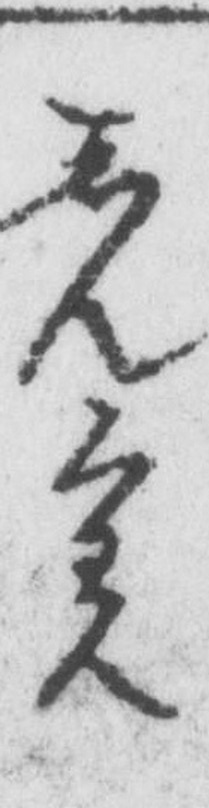せんくわい
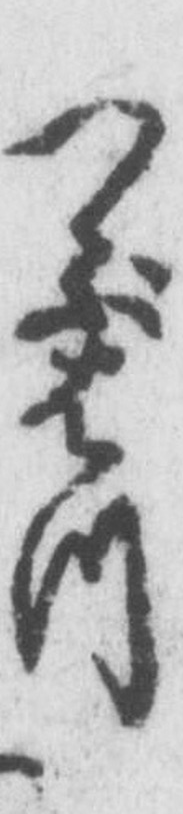つぶはつ
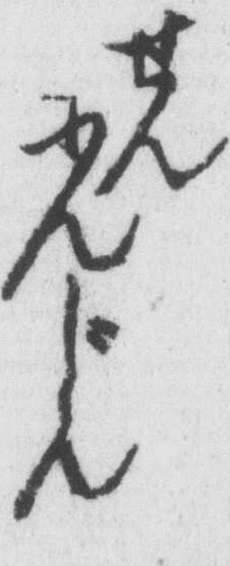せんせん
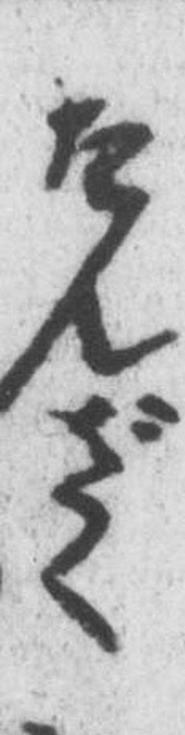たんざく
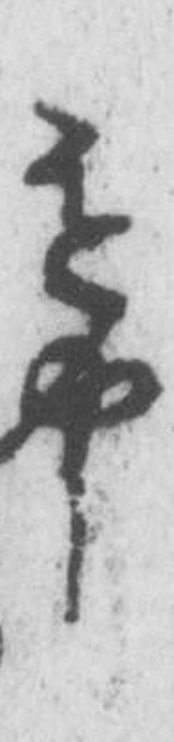もやし
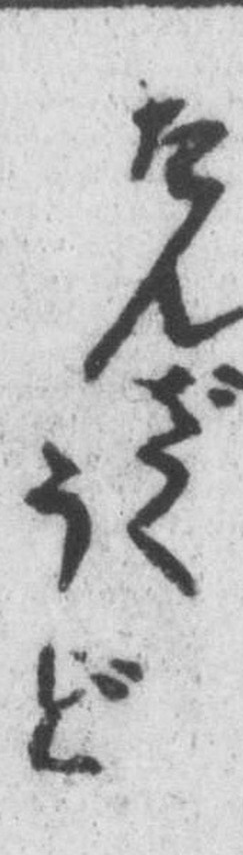たんざく
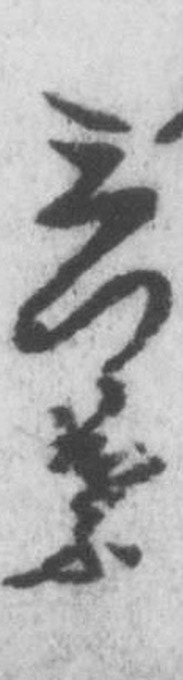三つ葉

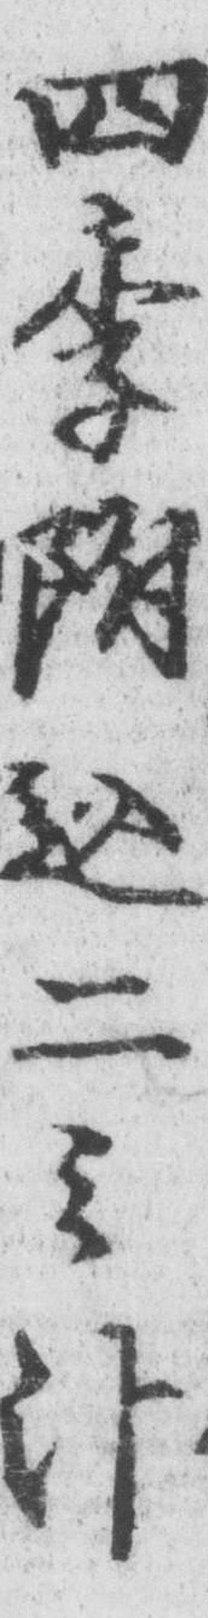四季附込二之汁
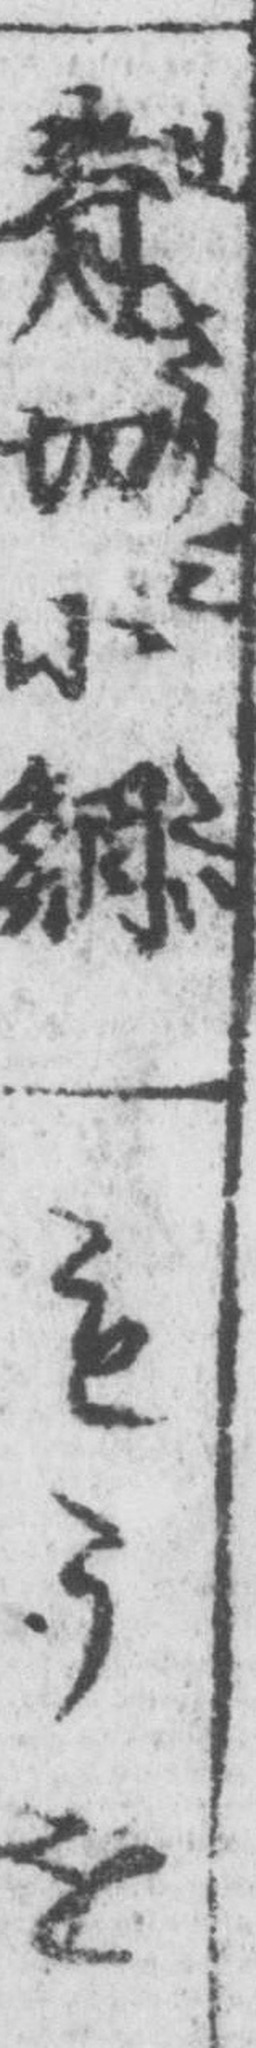煮切小鯛もうを
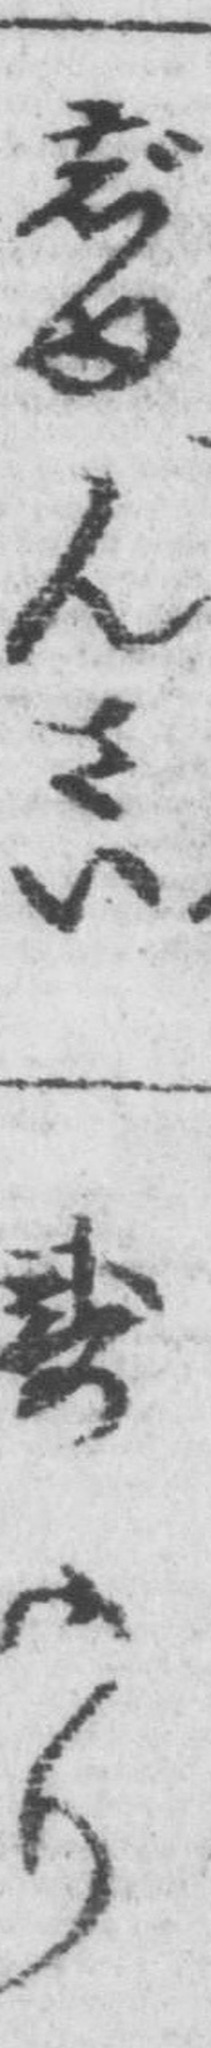じゆんさい寿のり
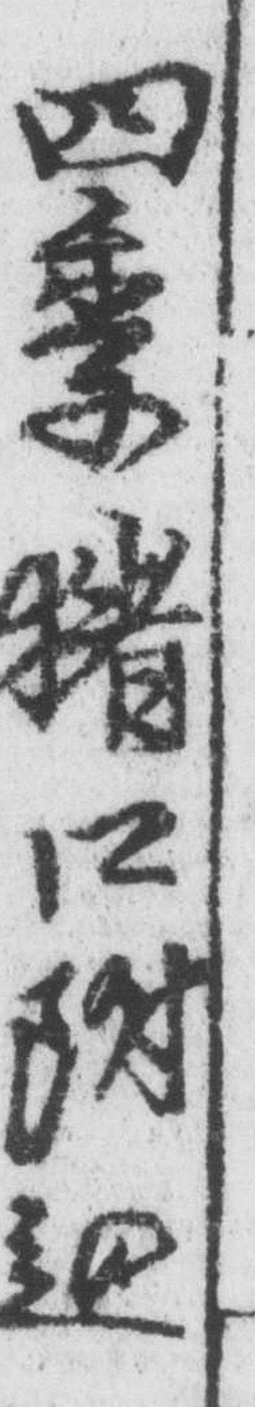四季猪口附込
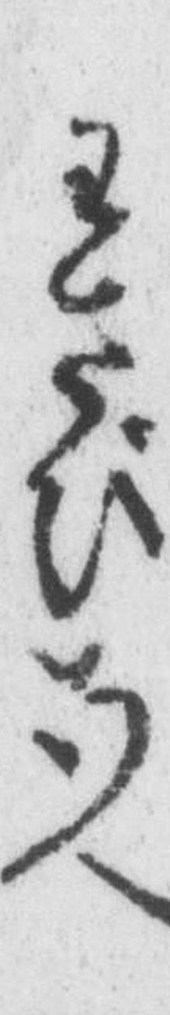わさびあへ
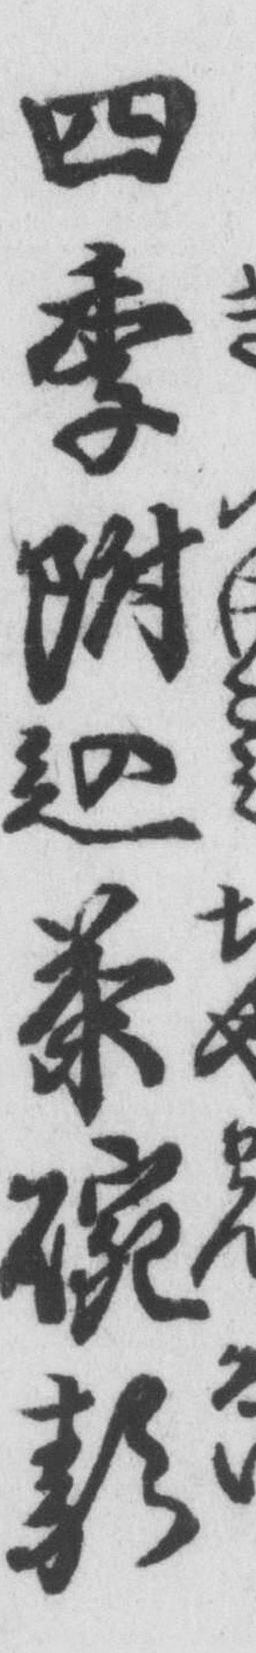四季附込茶碗類
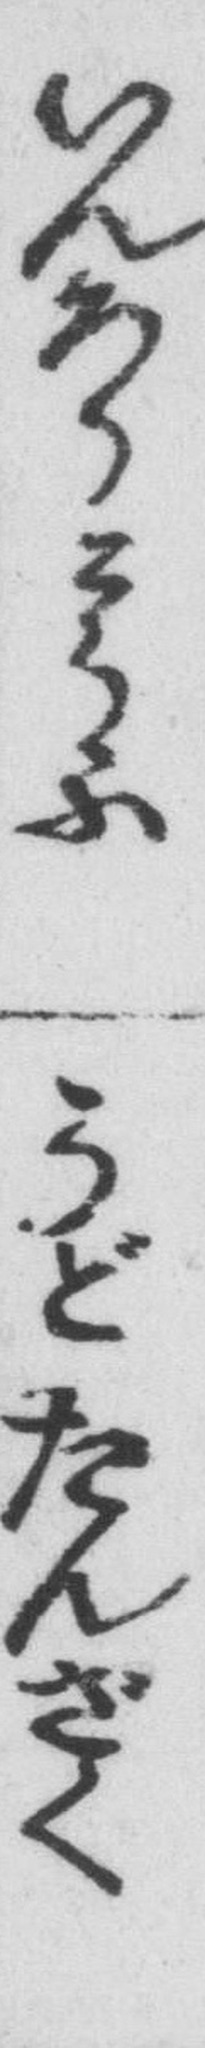いんろうとうふうどたんざく
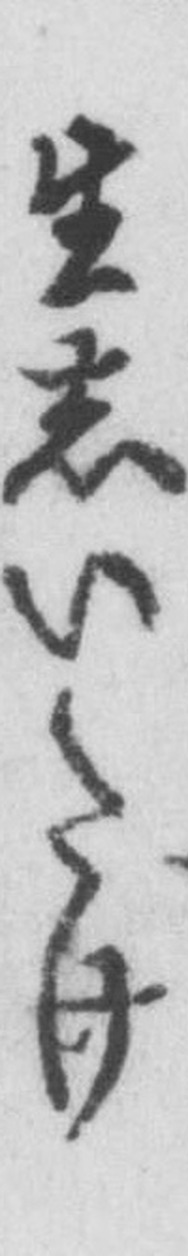生しいたけ
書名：当世料理献立
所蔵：大阪府立大学学術情報センター 国文学研究資料館
